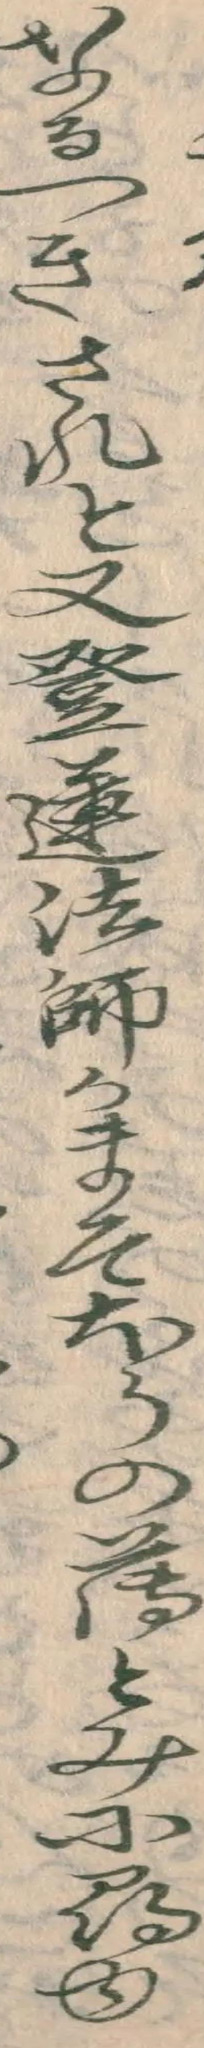なるへきされと又登蓮法師かまそほうの薄とみに尋ゆ
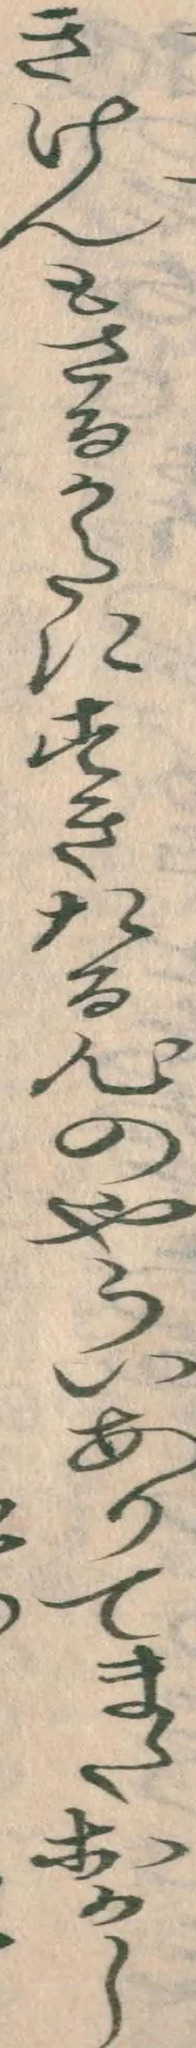きけんもさるかたにすきたる心のやういありてまたおかし
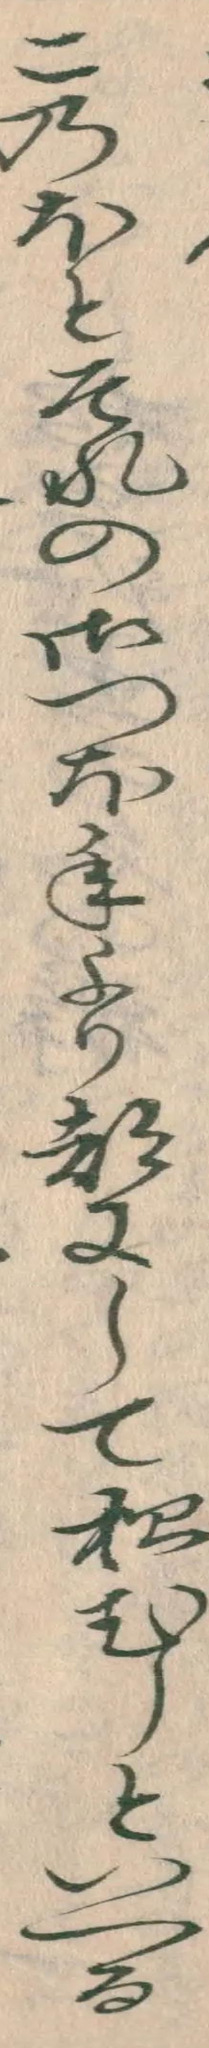このほとそれの御つほねより都にして松むしといへる
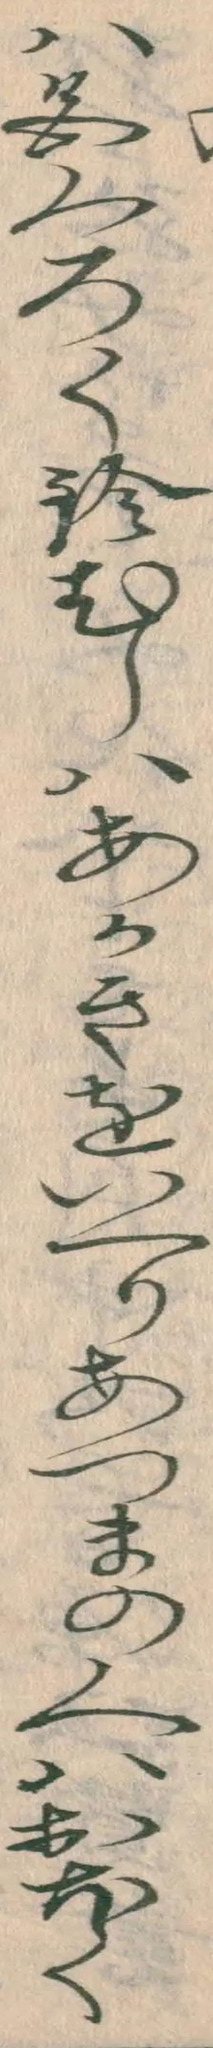は色くろく鈴むしはあかきをいへりあつまの人はおほく
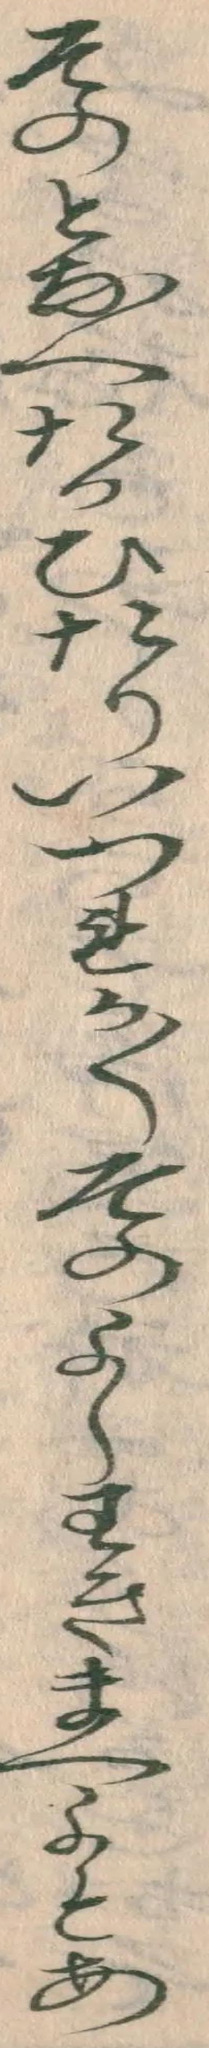そのとなへたかひたりいつれかくそのよしわきまへよとあ
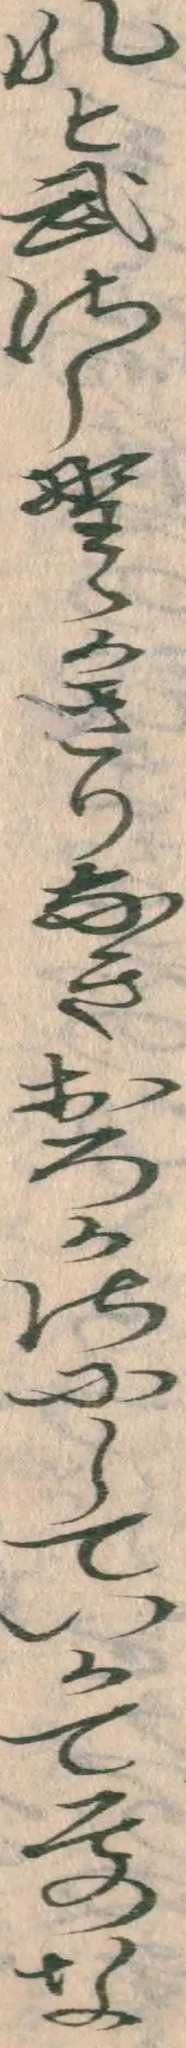れと武さし野のかきりなきおろかさにしていかてそのな
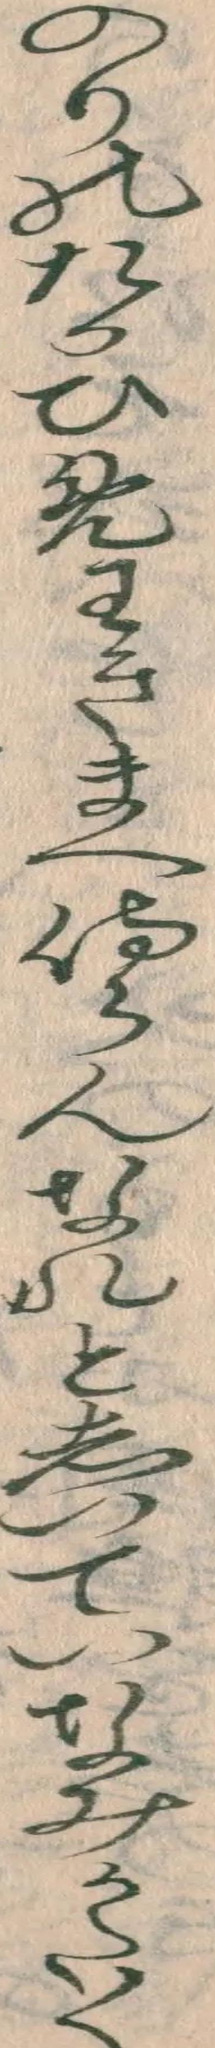のりのたかひ免わきまへ侍らんなれとしいていなみかたく
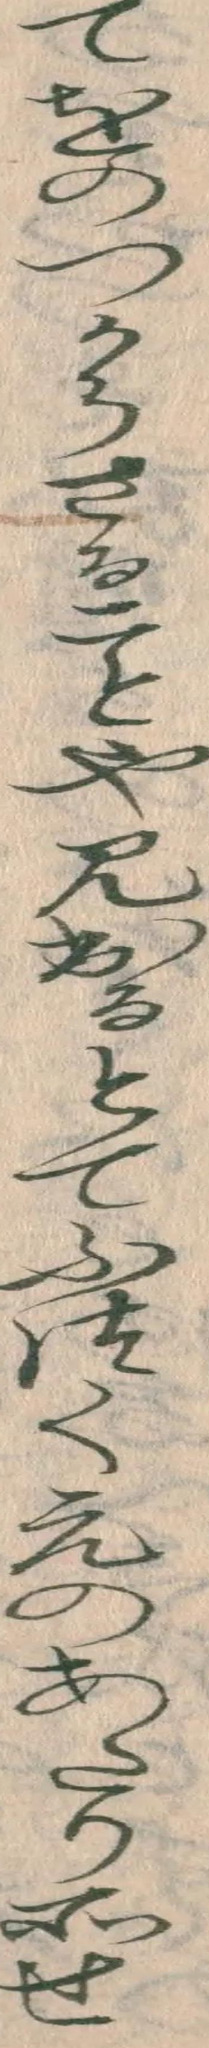てをのつからさることや見出るとてふつくえのあたり所せ
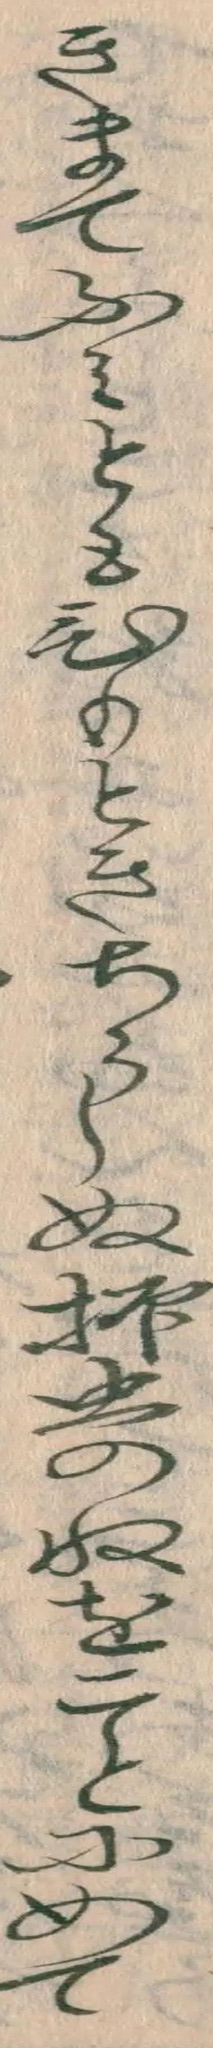きまてふみともひもときちらしぬ抑虫のねをことにめて
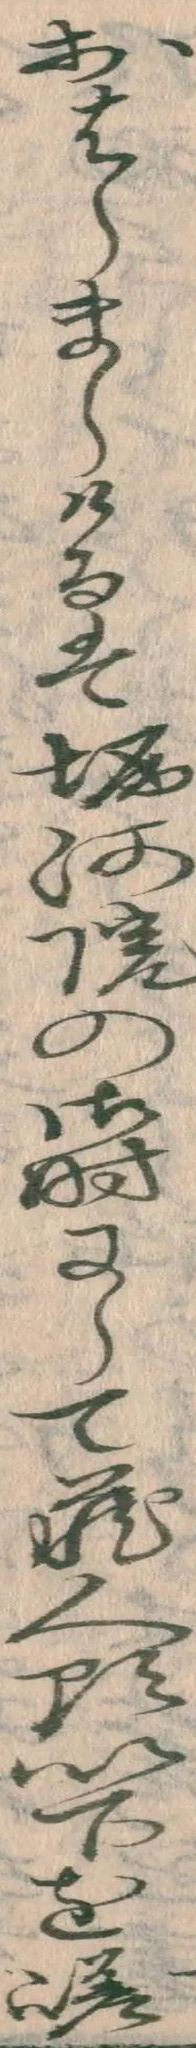おはしましけるは堀川院の御時にして蔵人頭以下嵯
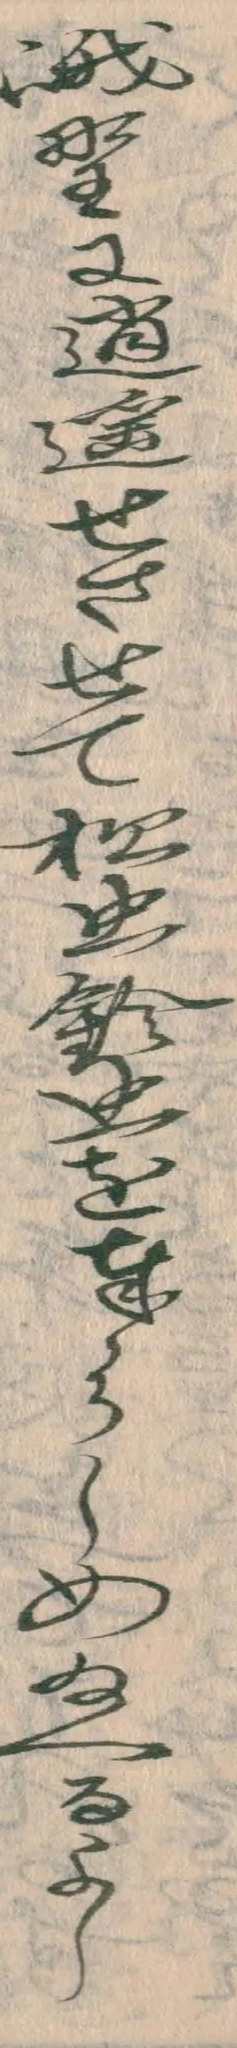峨野に逍遥せさせて松虫鈴虫を奉らしめ給へるよし
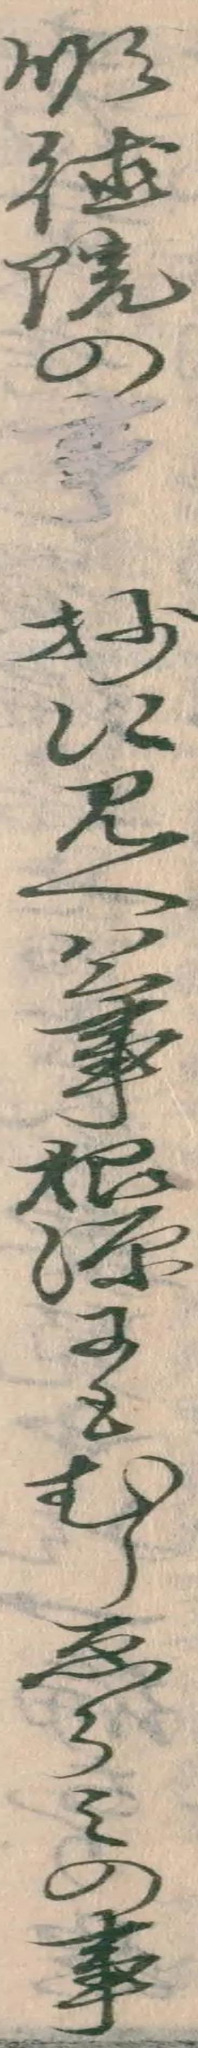順徳院抄に見へ公事根源にもむしゑらみの事
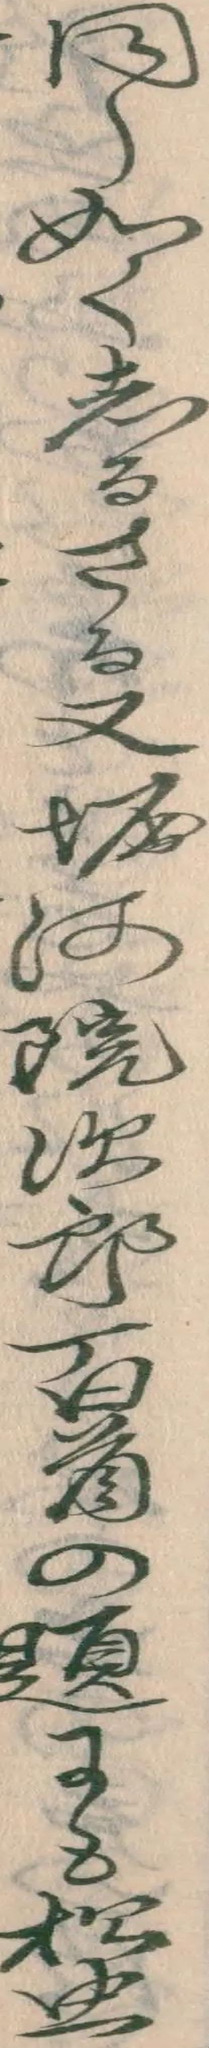同し如くしるさる又堀河院次郎百首の題にも松虫
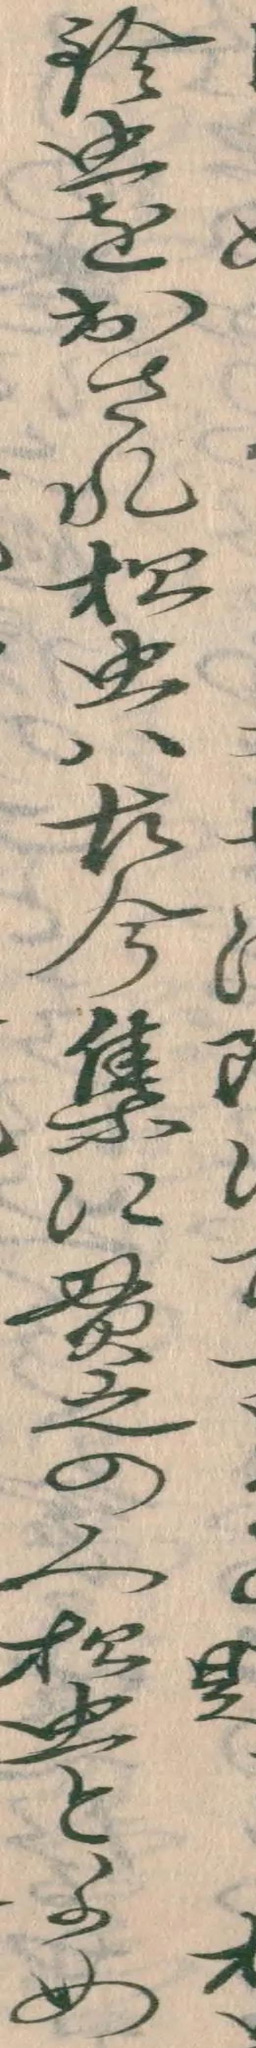鈴虫を出され松虫は古今集に貫之の人松虫とよめ
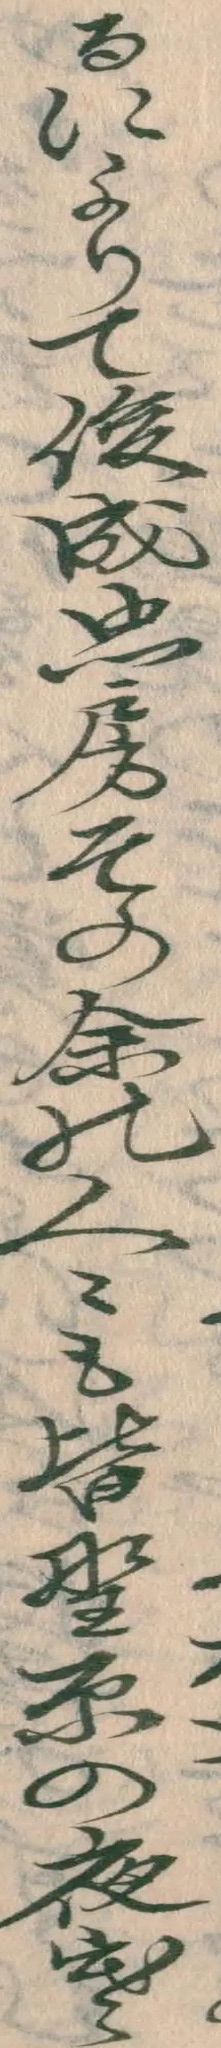るによりて俊成忠房その余の人々も皆野原の夜寒
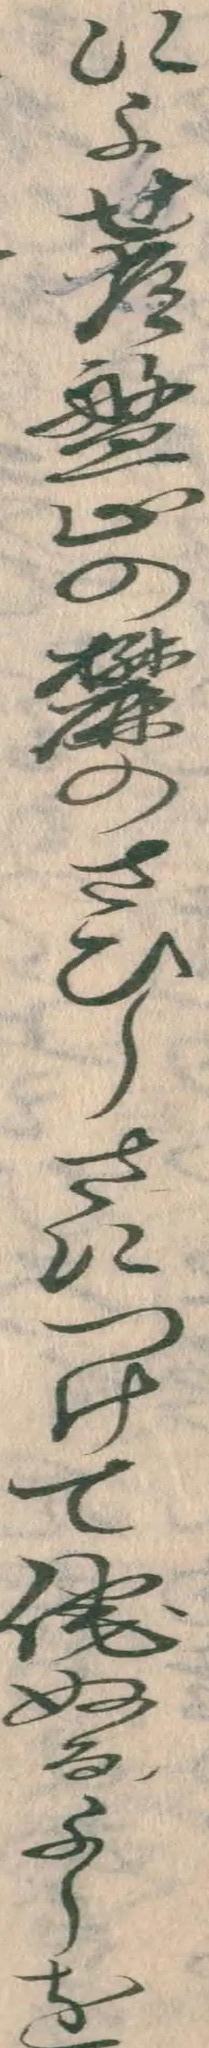によせ常盤山の麓のさひしさにつけて侘ぬるよしを
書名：千蟲譜 3巻. [3]
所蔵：国立国会図書館 National Diet Library, JAPAN
